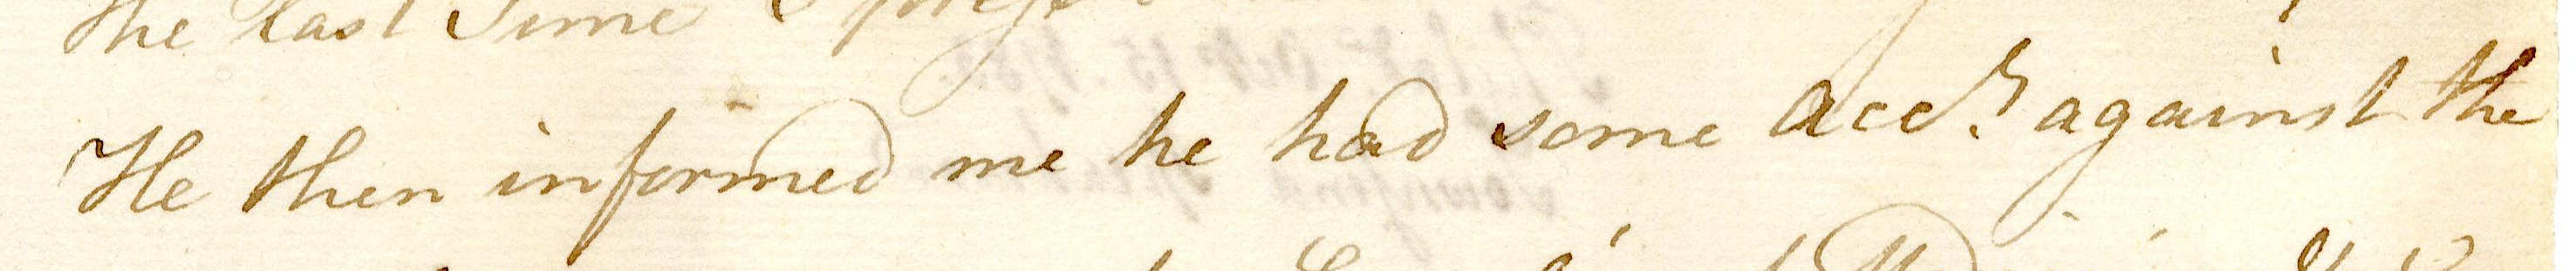He then informed me he had some Acc^t. against the
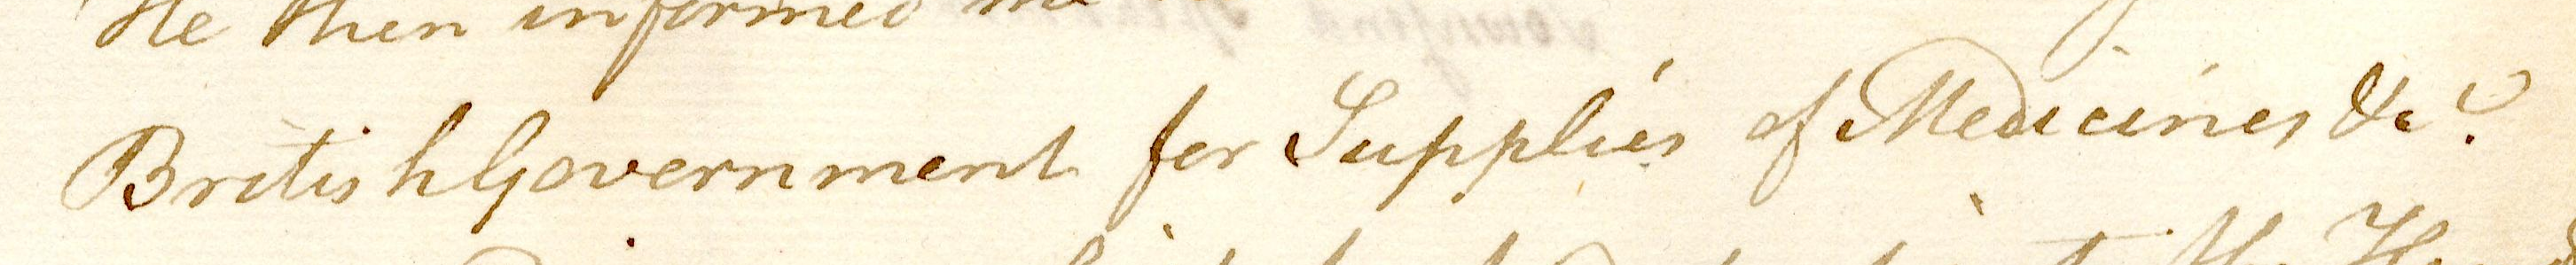British Government for Supplies of Medicines &c.
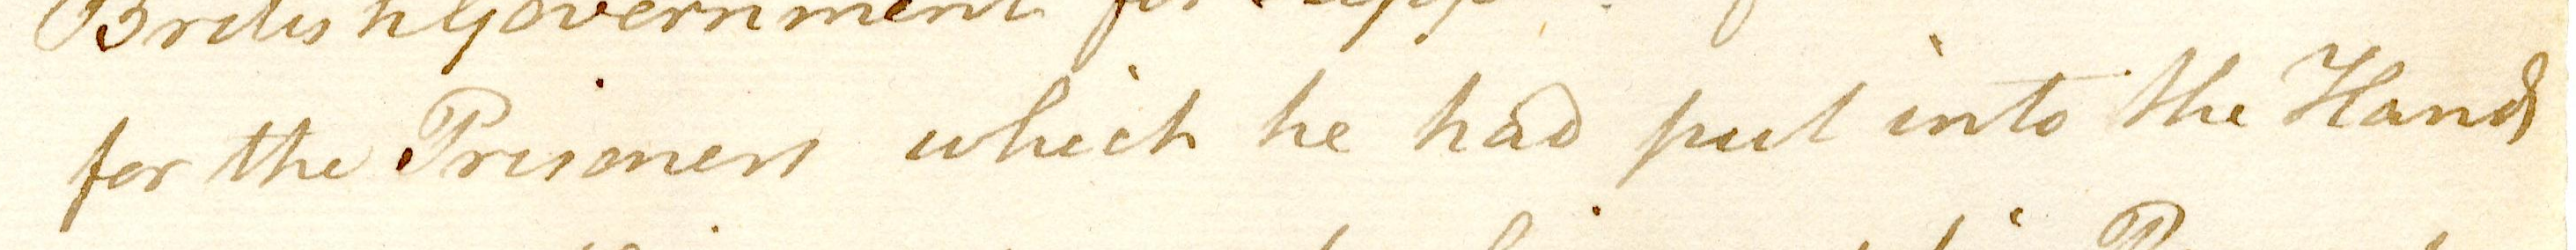for the Prisoners which he had put into the Hand
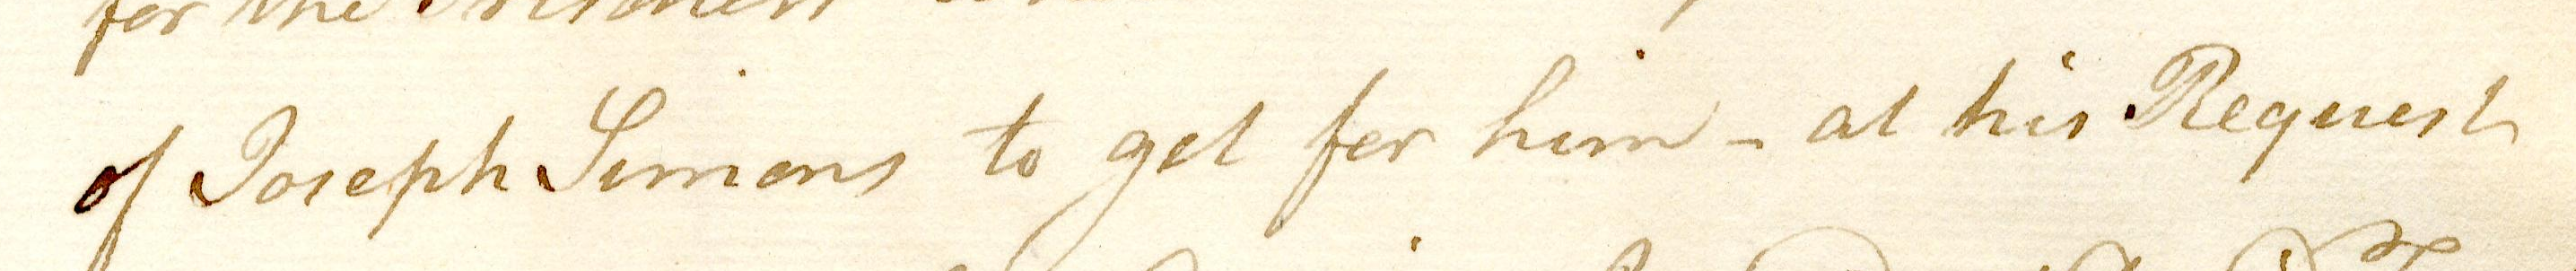of Joseph Simons to get for him- at his Request
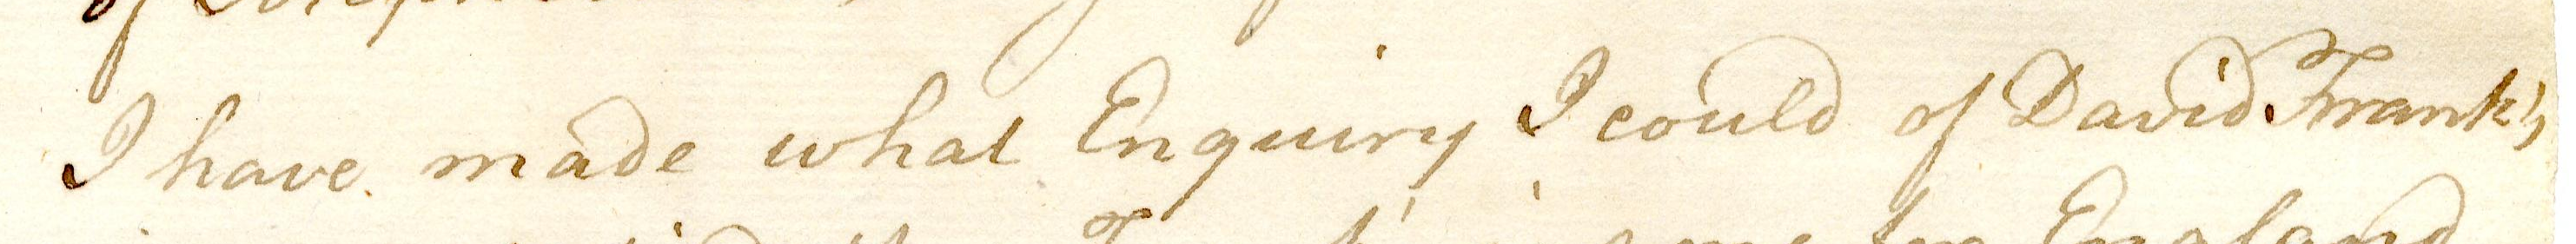I have made what Enquiry I could of David Frank
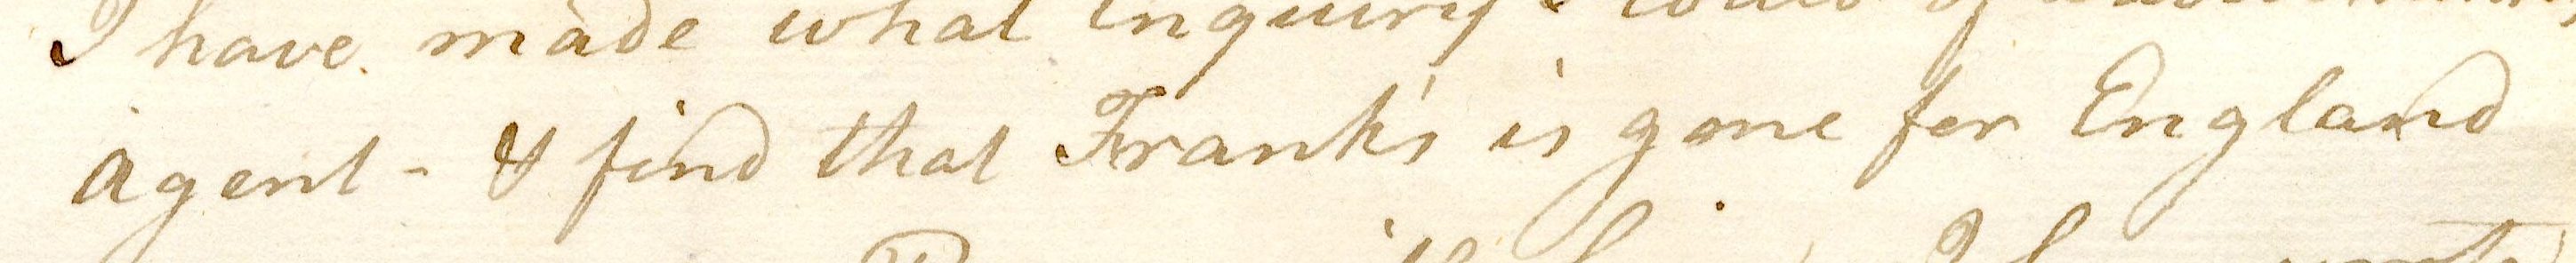Agent- & find that Franks is gone for England
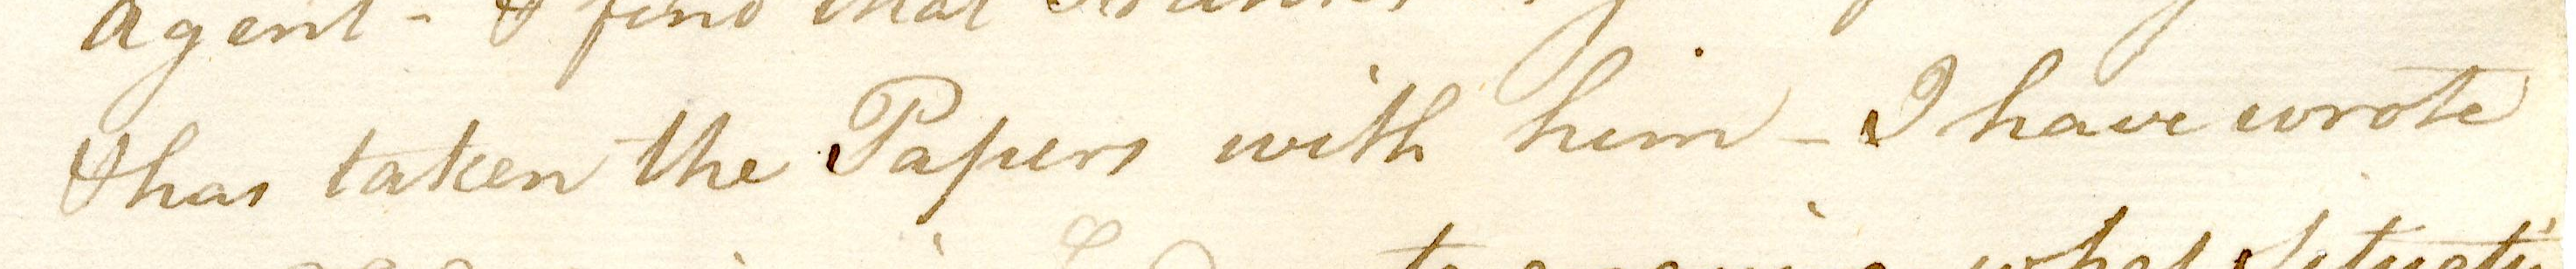& has taken the Papers with him. I have wrote
